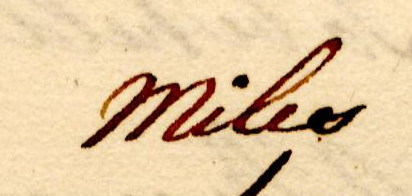Miles
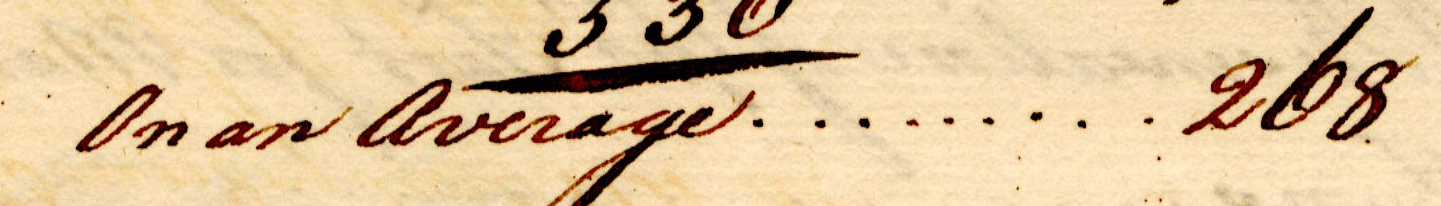On an Average......... 268
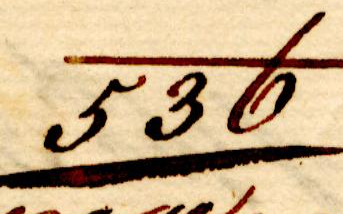536
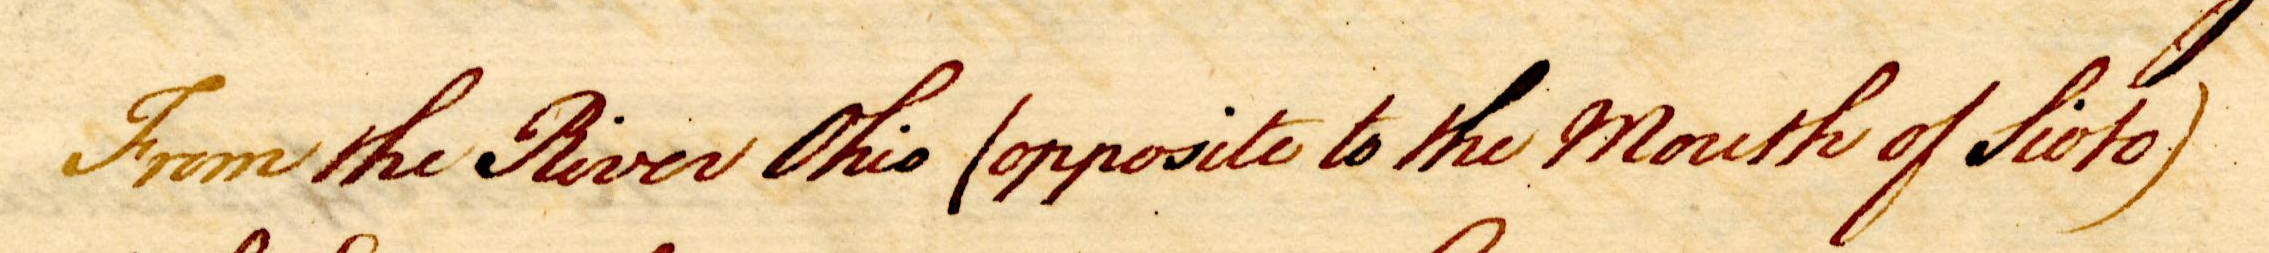From the River Ohio (opposite to the Mouth of Sioto)
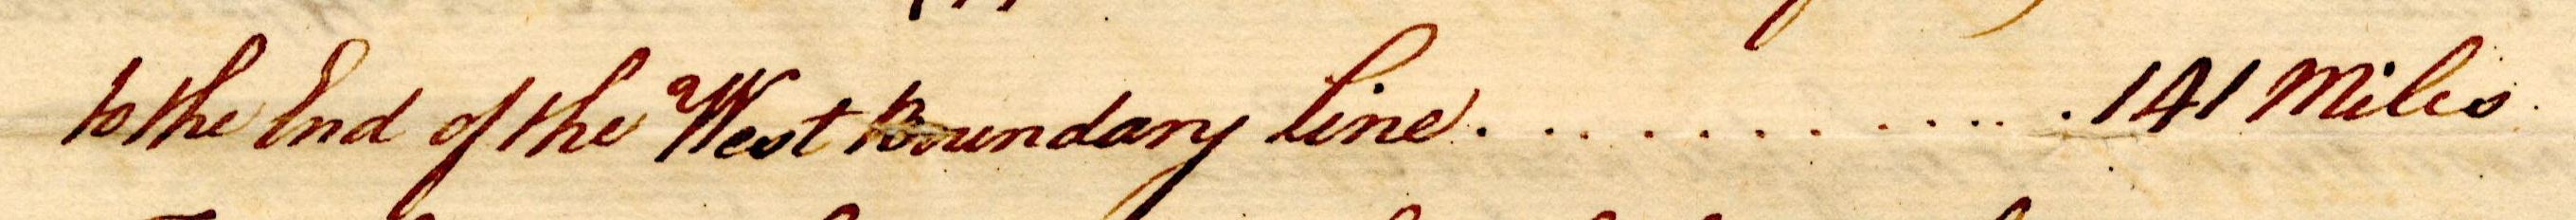to the End of the West Boundary line............ 141 Miles
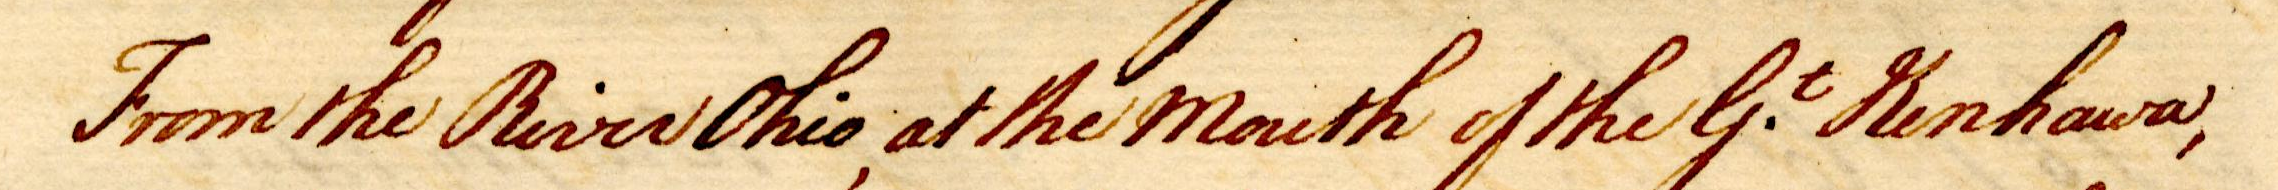From the River Ohio at the Mouth of the G^t. Kenhawa,
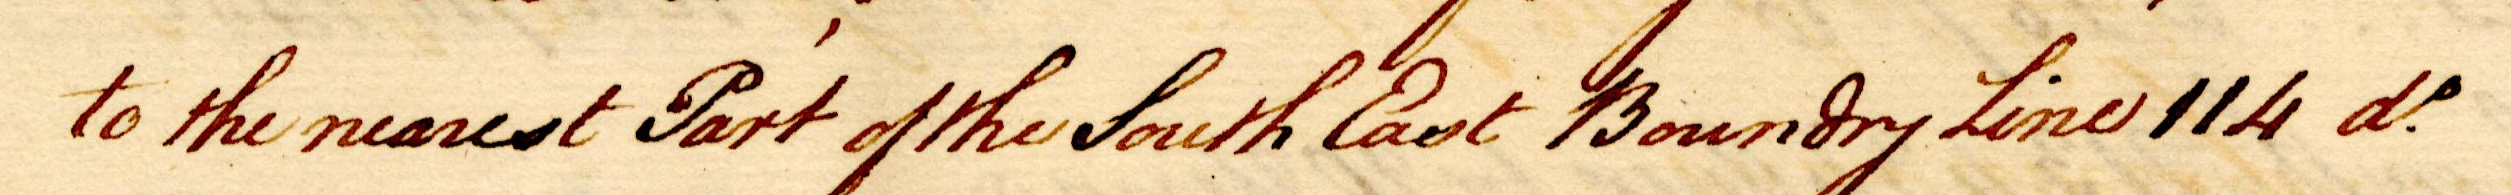to the nearest Part of the South last Boundry Line 114 d^o
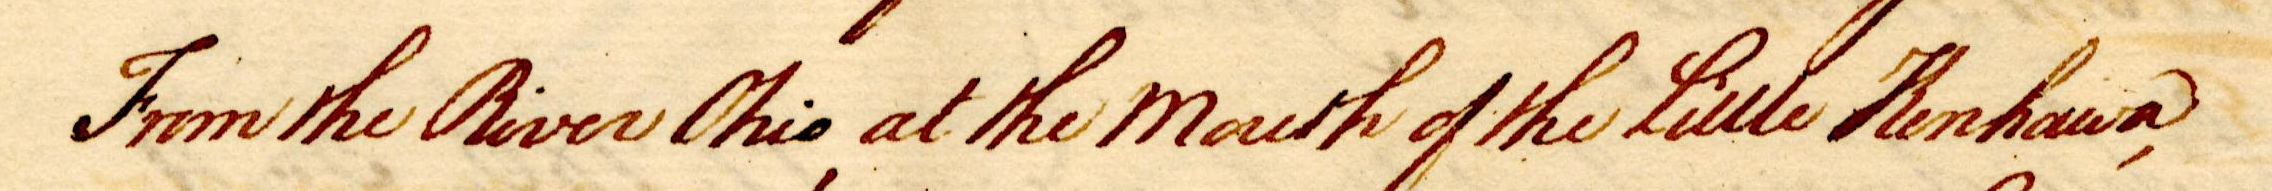From the River Ohio at the Mouth of the Little Kenhawa
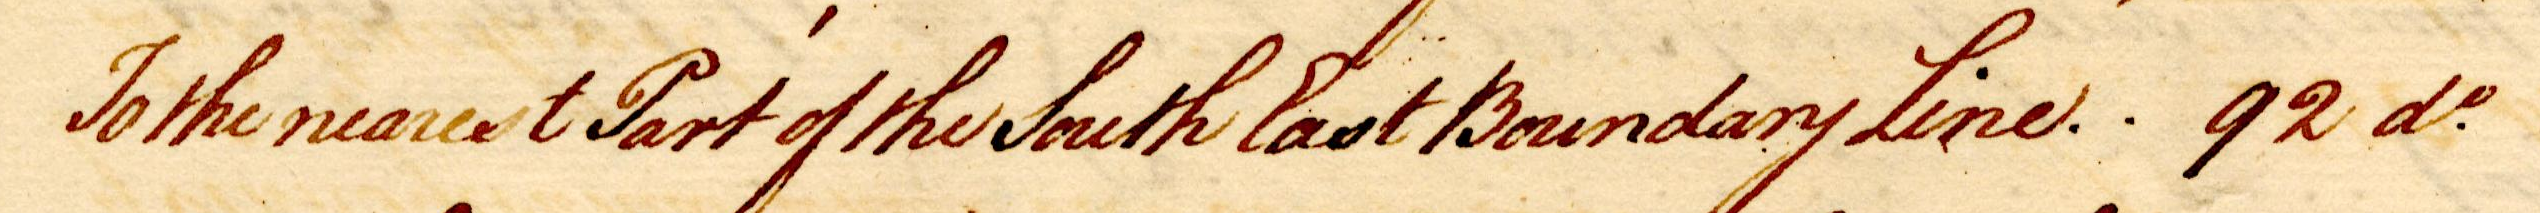To the nearest Part of the South East Boundary Line.. 92 d^o.
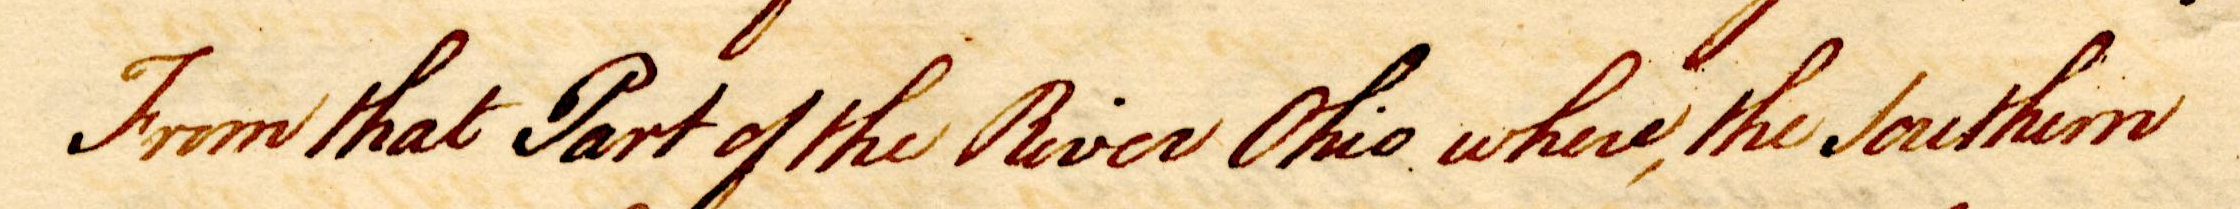From that Part of the River Ohio where, the Southern
